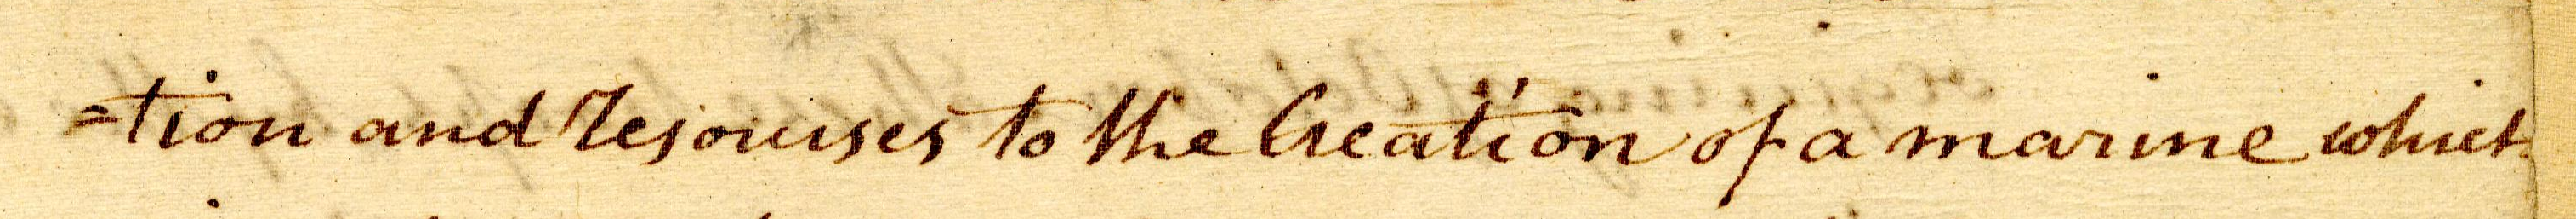-tion and resources to the Creation of a marine which
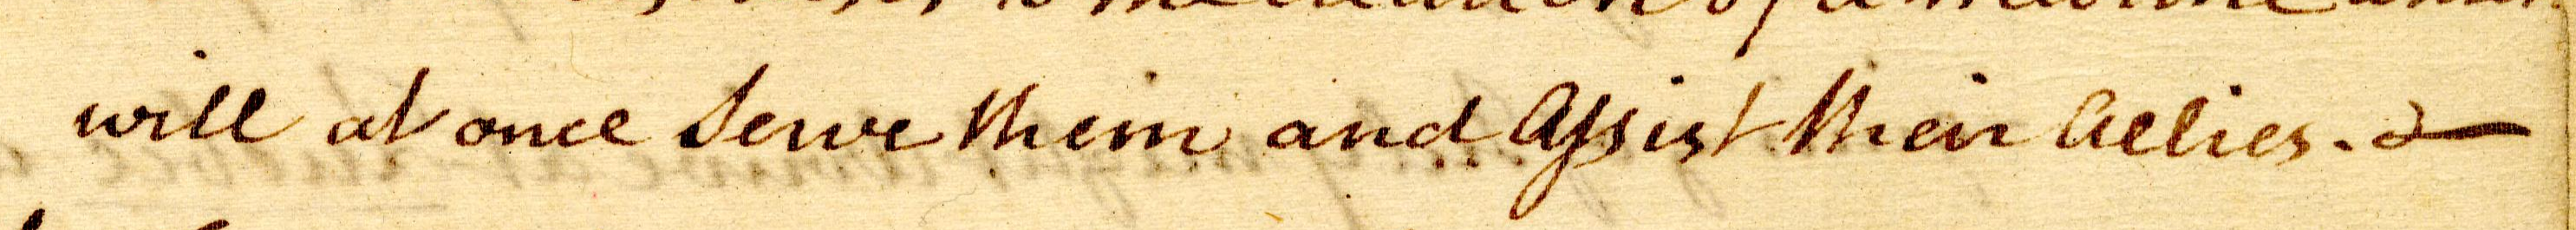will at once serve them and Assist their Allies.-
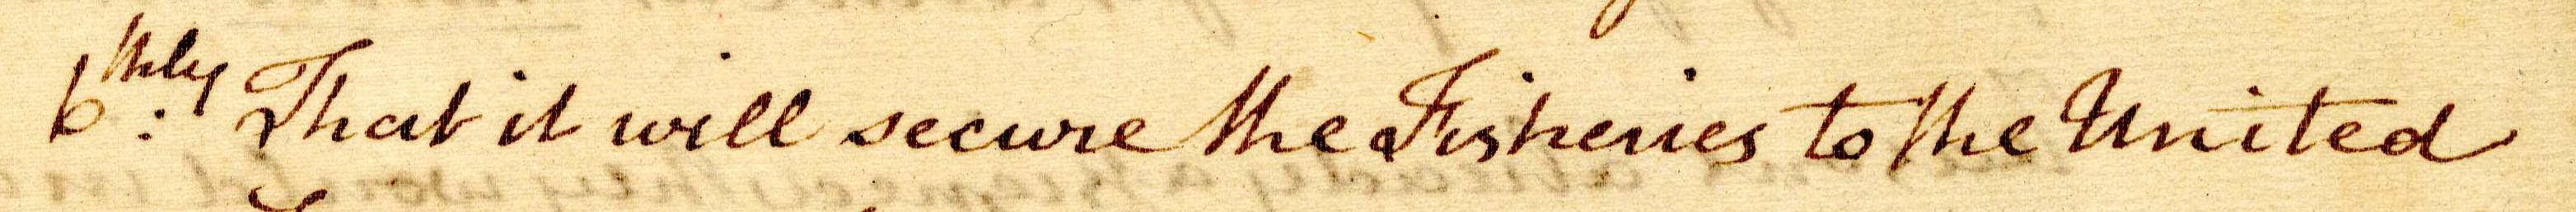6^thy: That it will secure the Fisheries to the United
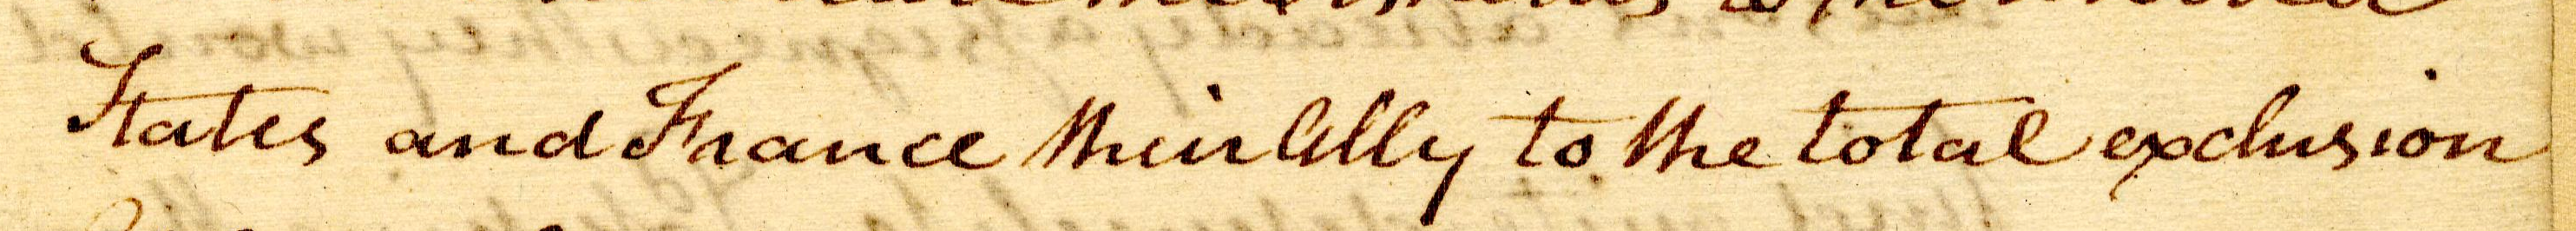States and France their Ally to the total exclusion
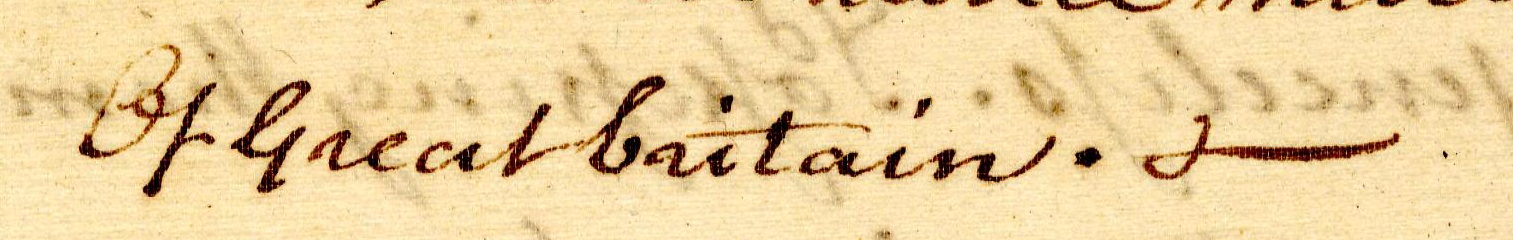Of Great britain.-
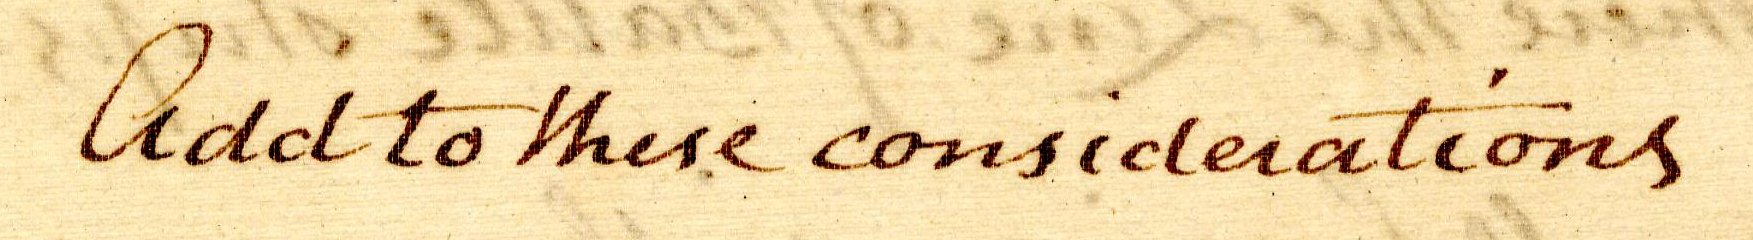Add to these considerations
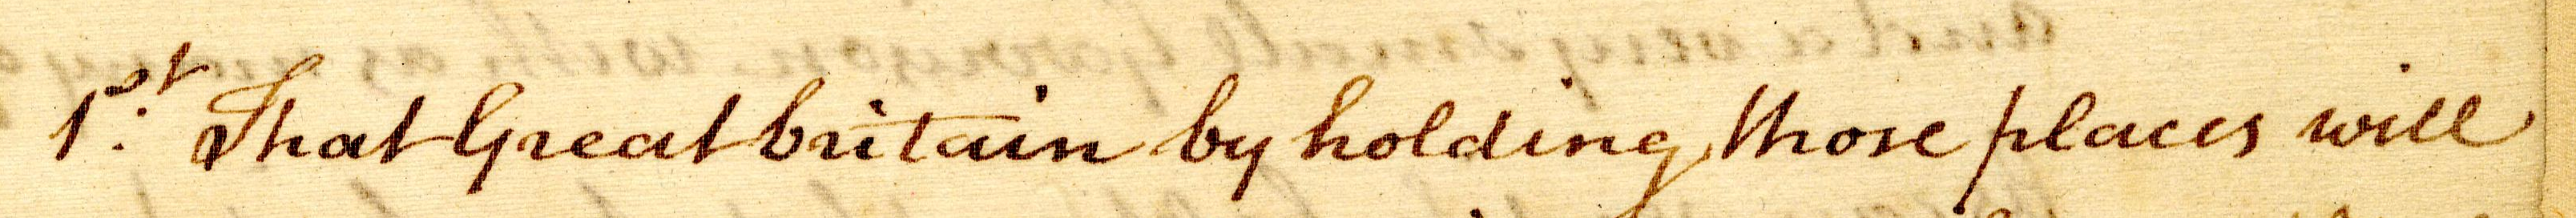1^st: That Great britain by holding those places will
